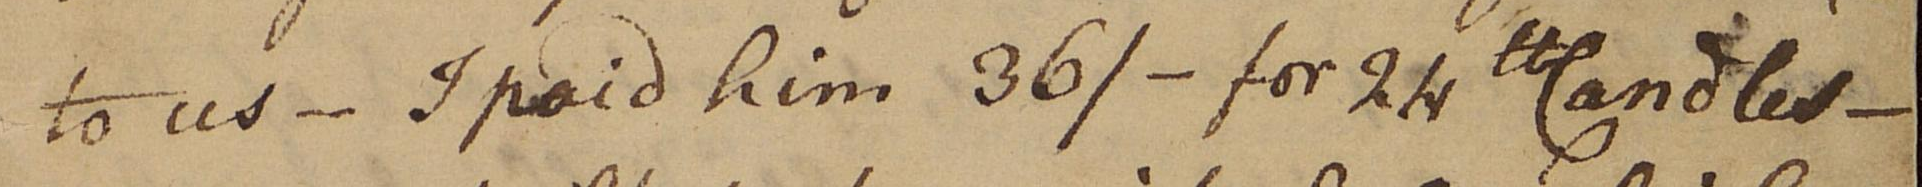to us- I paid him 36s- for 24^lb Candles-
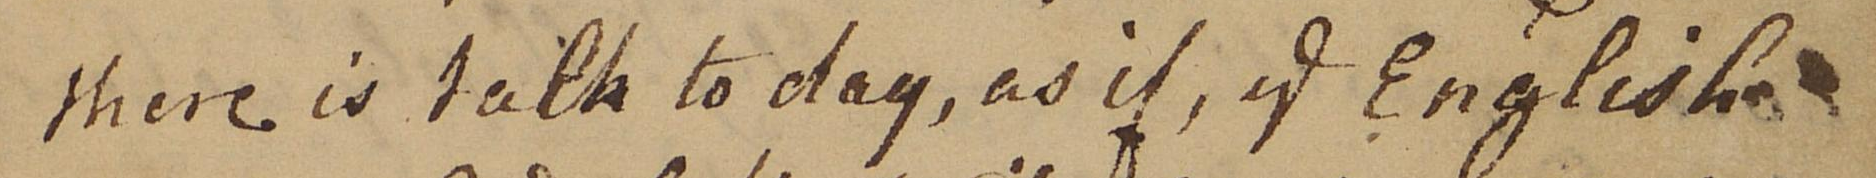there is talk to day, as if, y^e English
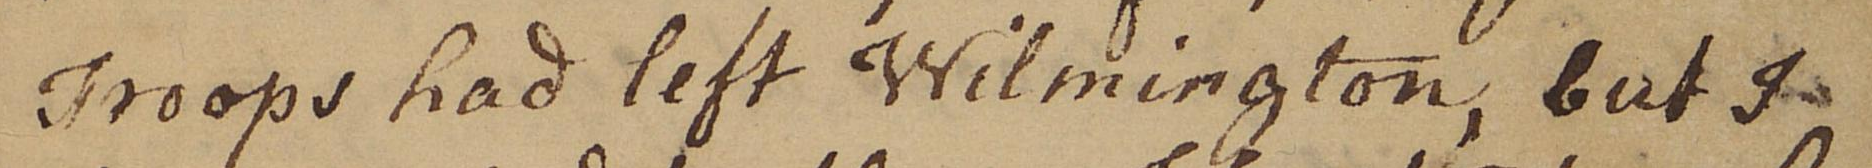Troops had left Wilmington, but I
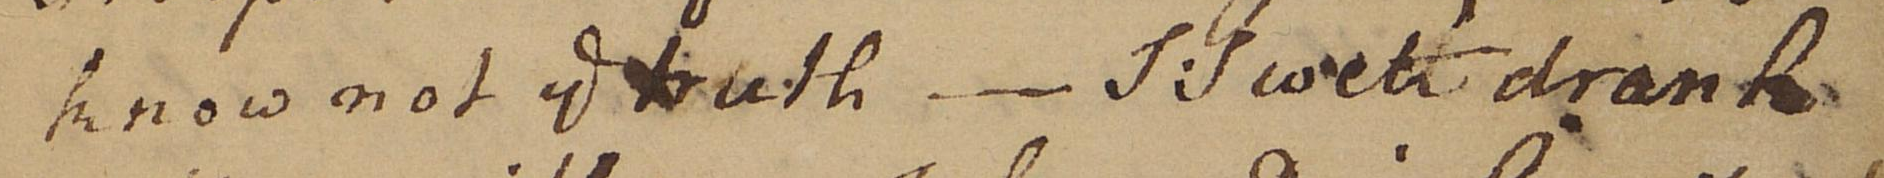know not y^e truth- S. Swett drank
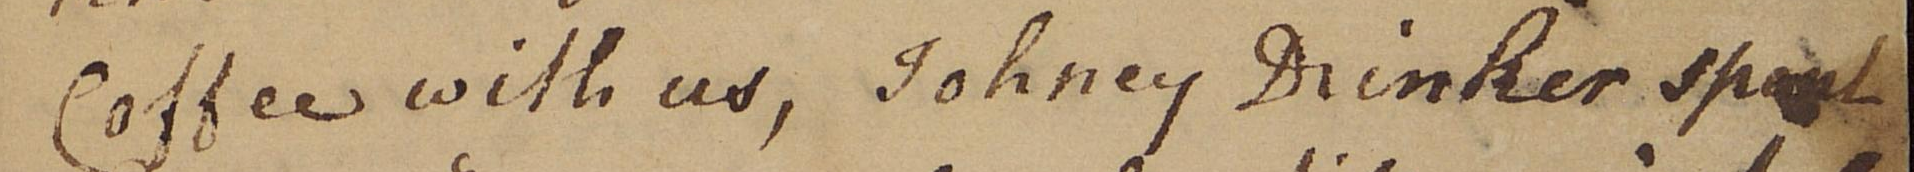Coffee with us, Johney Drinker spent
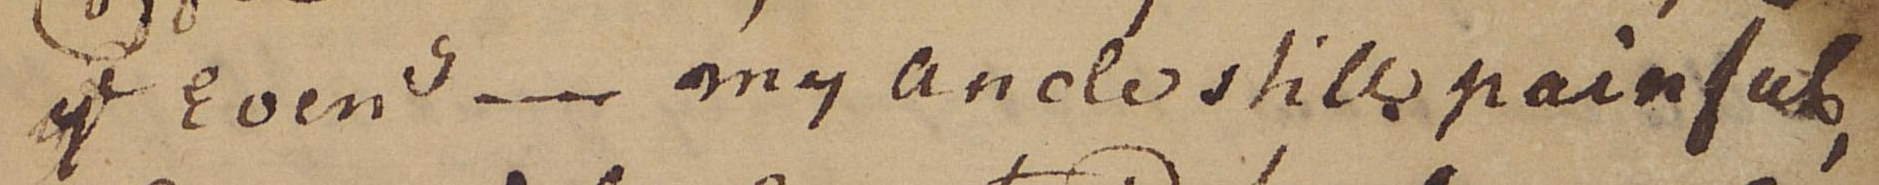y^e Even^g- my Ancle still painful
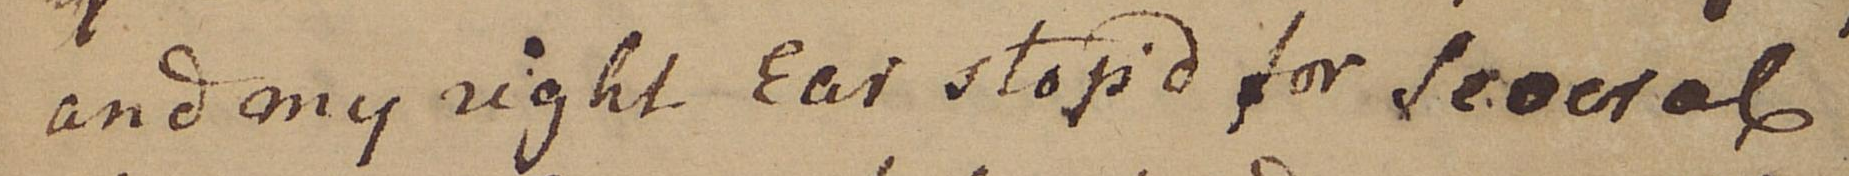and my right Ear stop'd for several
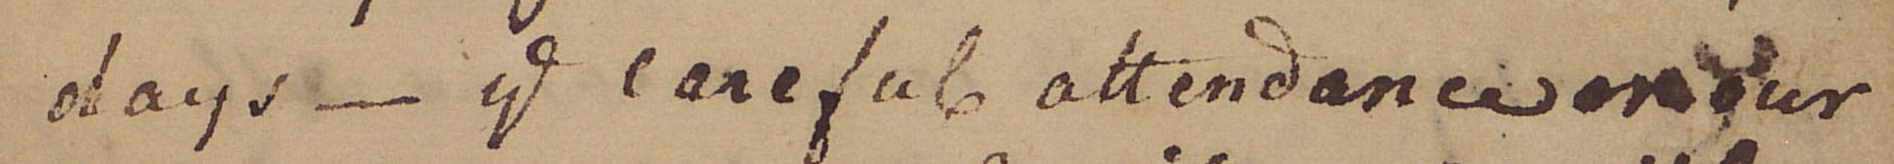days- y^e careful attendance on our
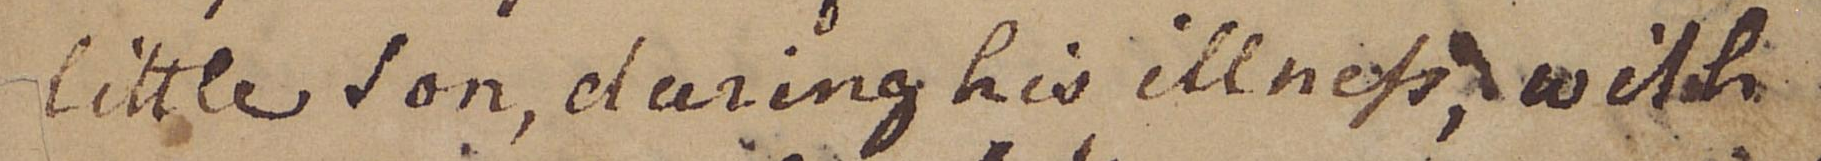little son, daring his illness; with
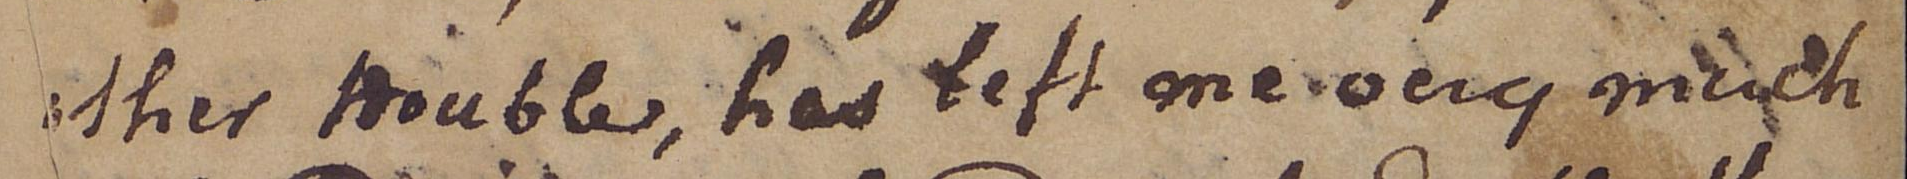other trouble, has left me very much
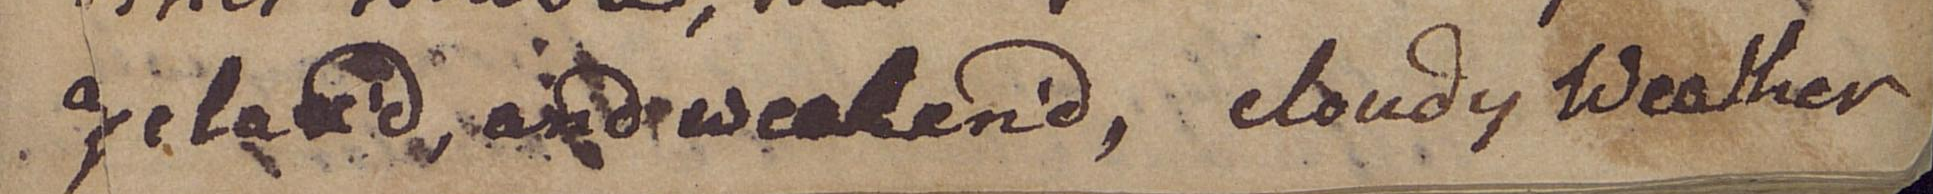relax'd, and weaken'd, cloudy Weather
